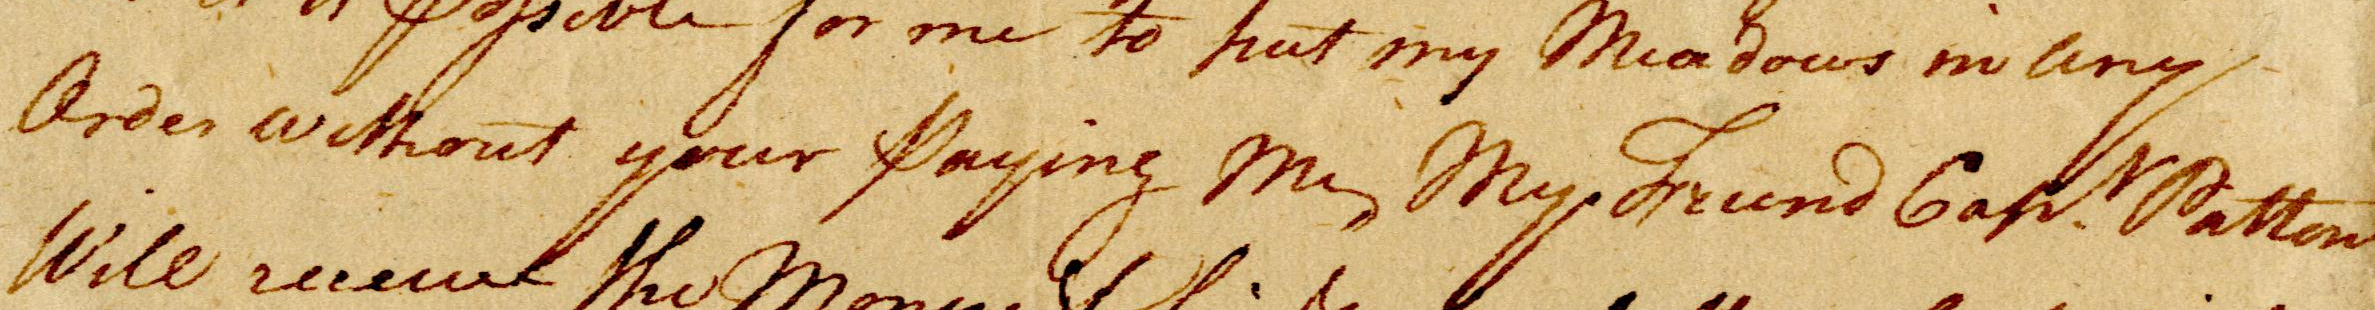Order without your Paying me, My, Friend Cap^t. Patton
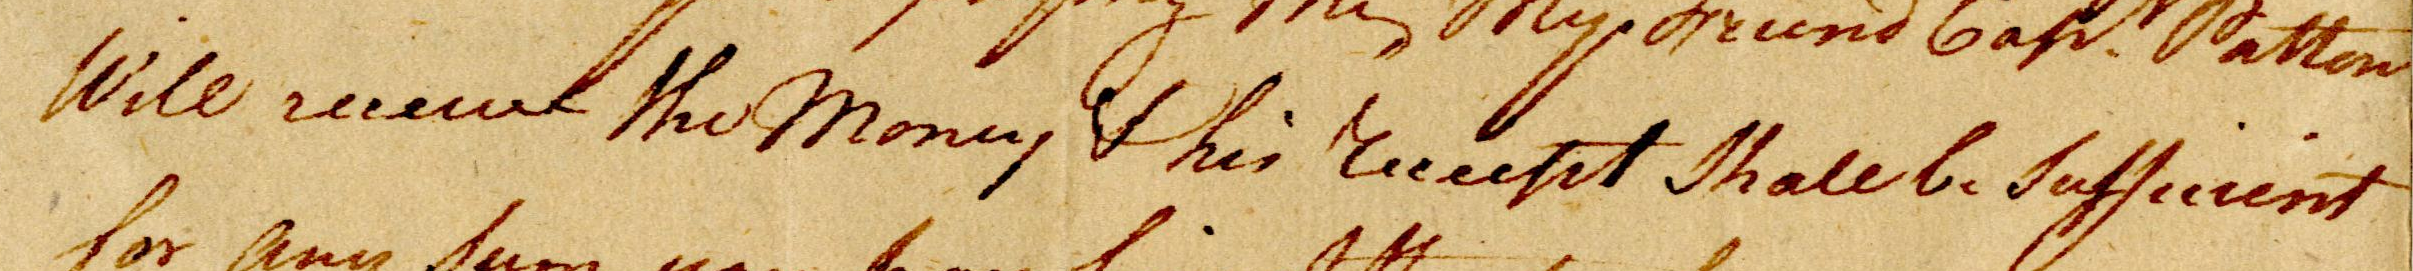Will receive the Money & his receipt shall be Sufficient
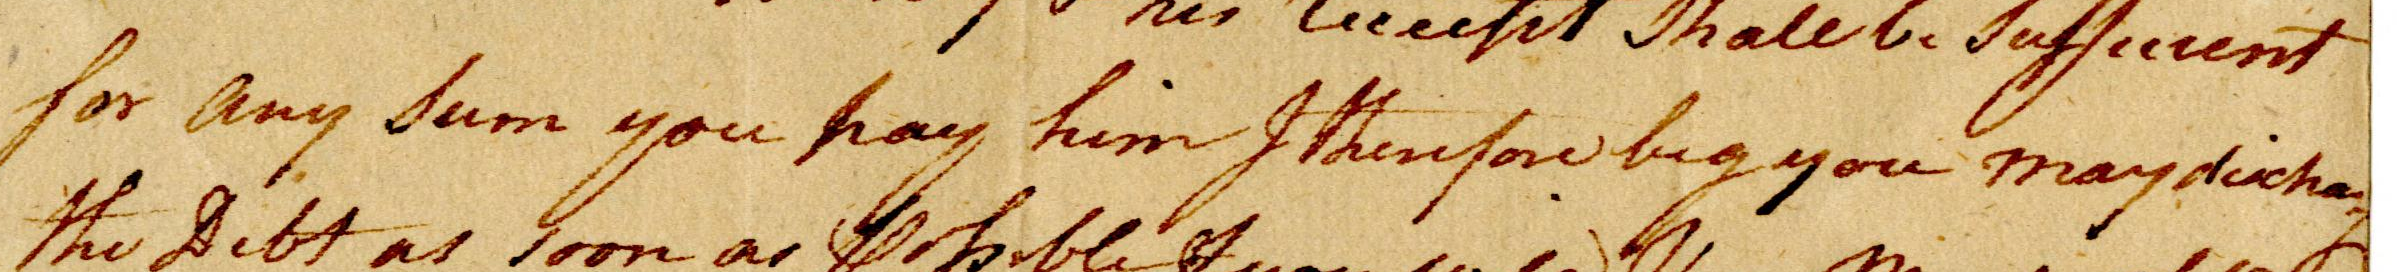for any Sum you pay him I therefore beg you may discharg
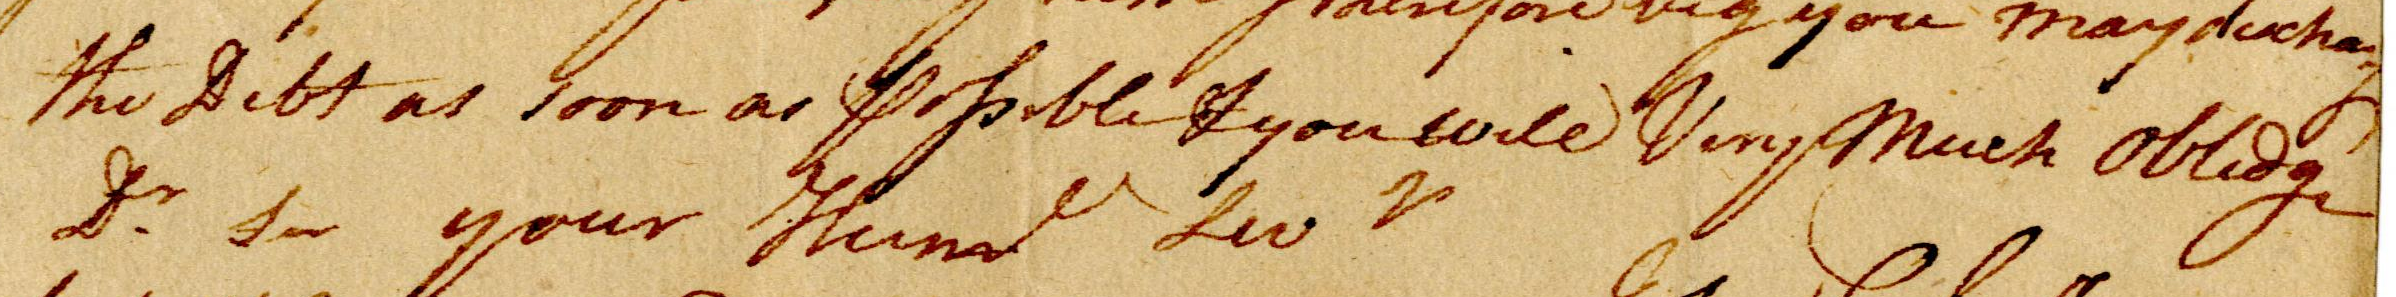the Debt as soon as possable & you will Very Much oblidge
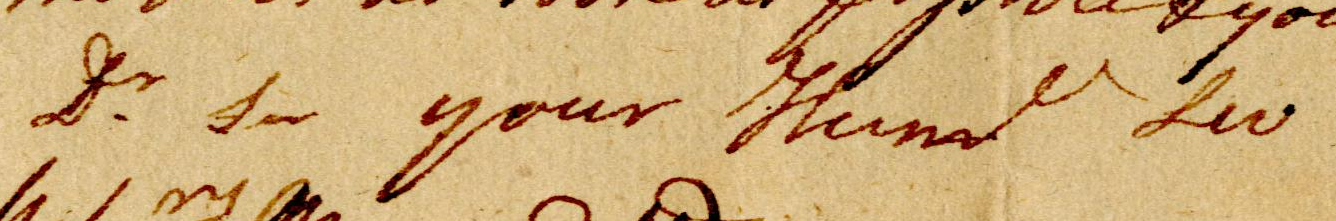D^r. sir your hum^le Serv
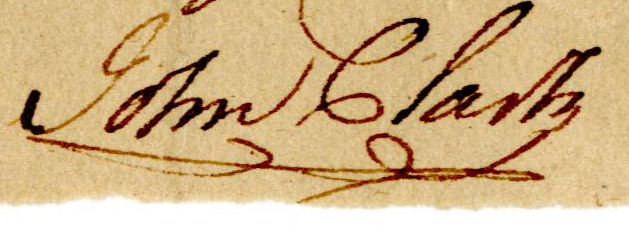John Clark
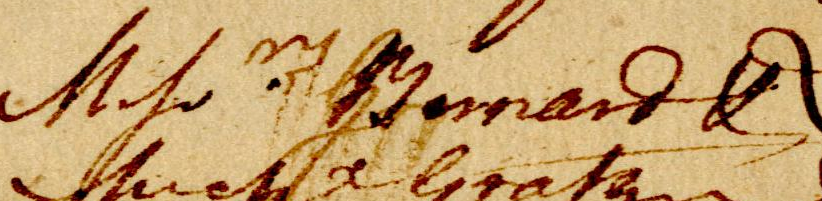Mess^rs Barnard &
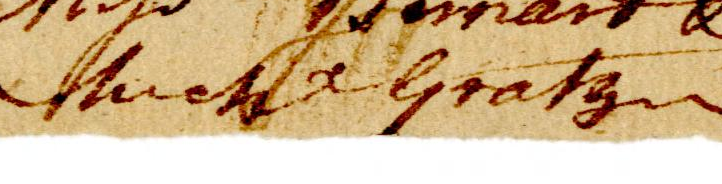Mich^l Gratz
